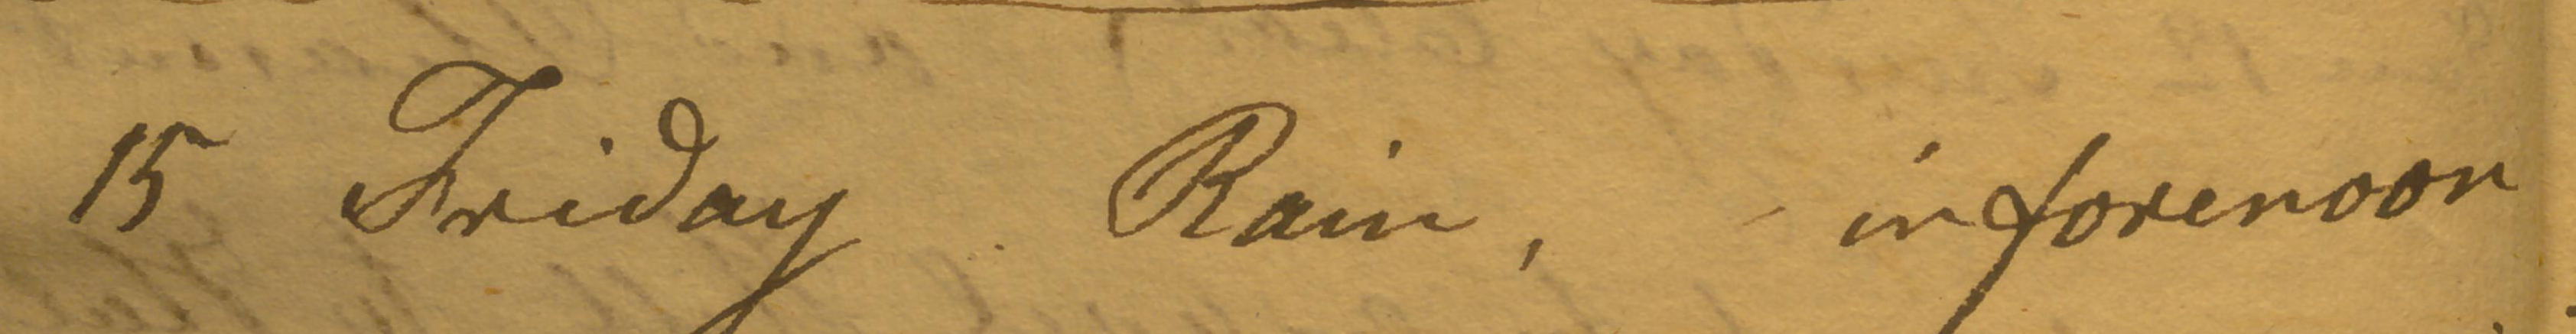15 Friday, Rain in forenoon
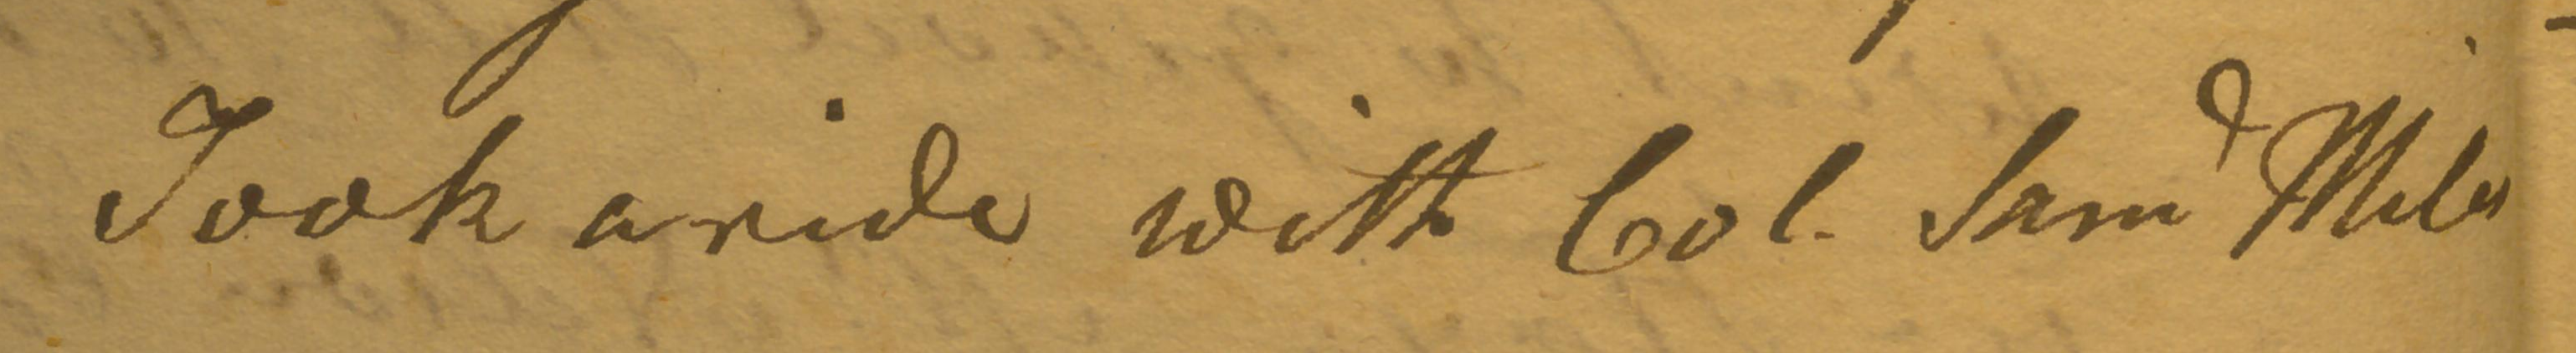Took a ride with Col. Sam^l Miles
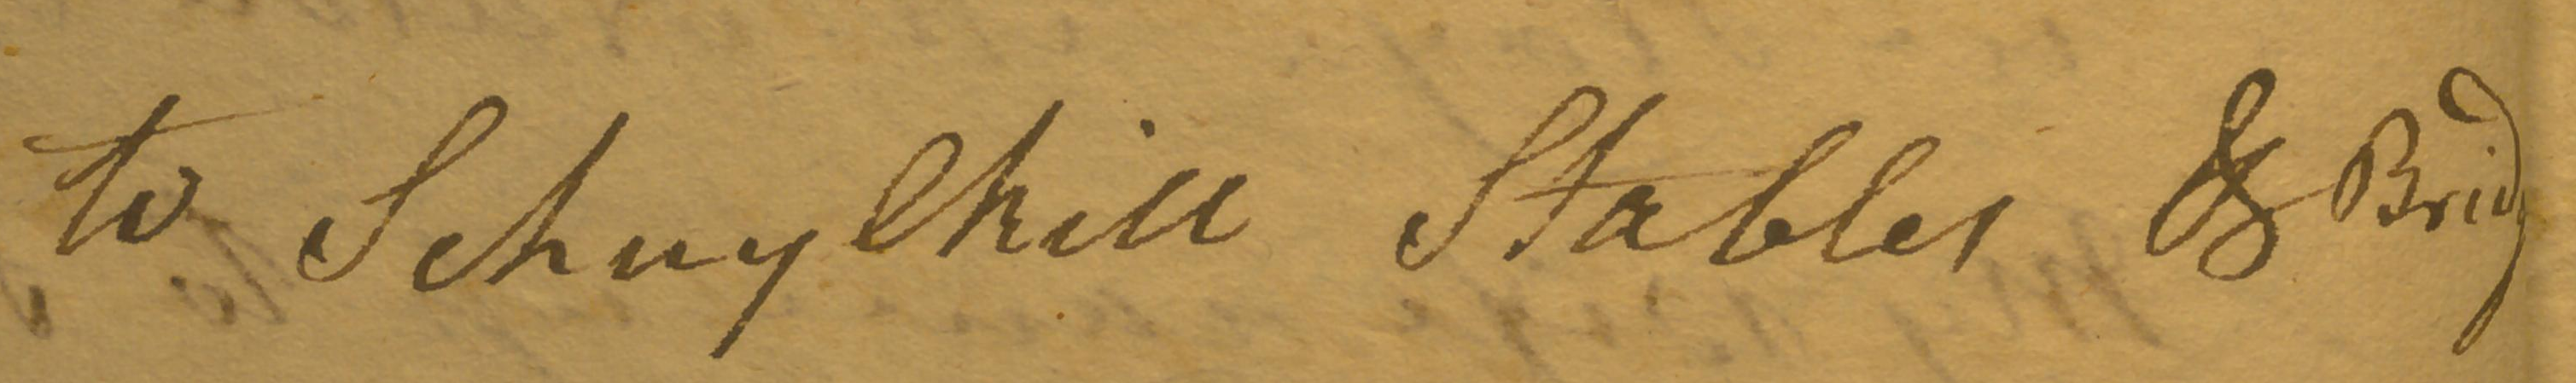to Schuylkill Stables, & Bridge
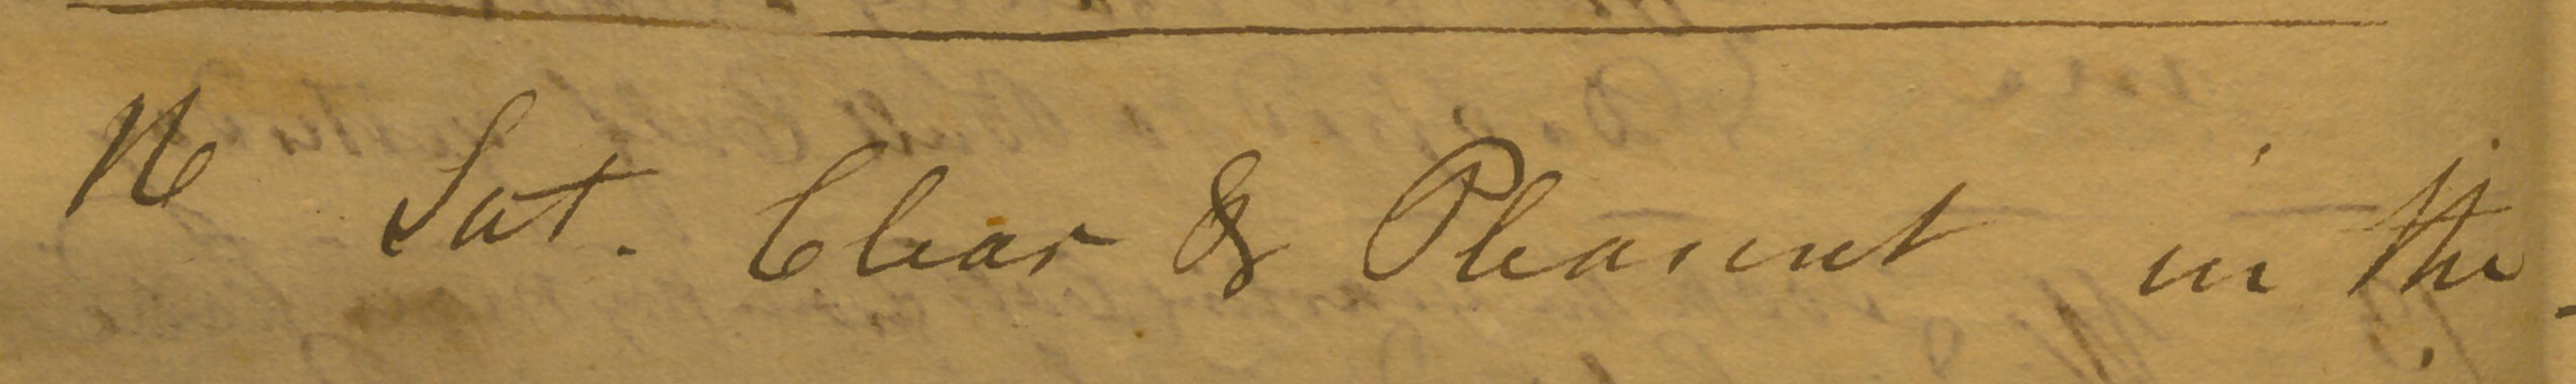16 Sat. Clear & Pleasent in the
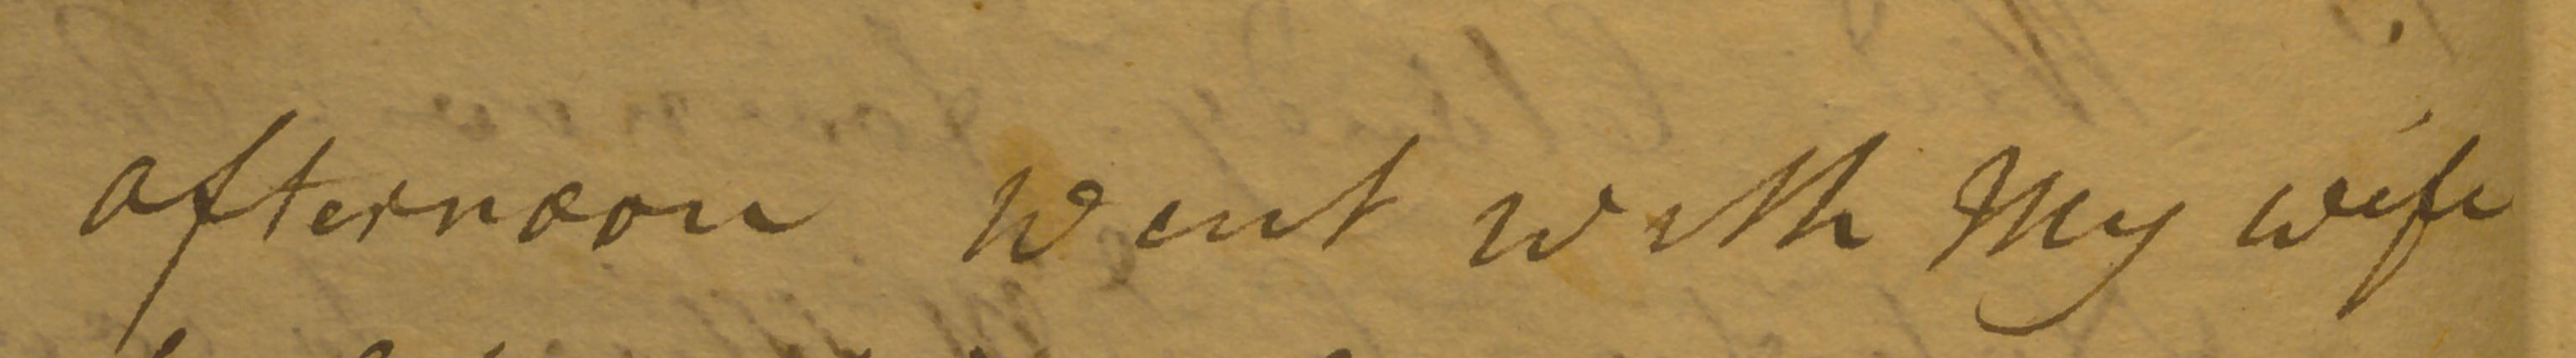afternoon went with My wife
